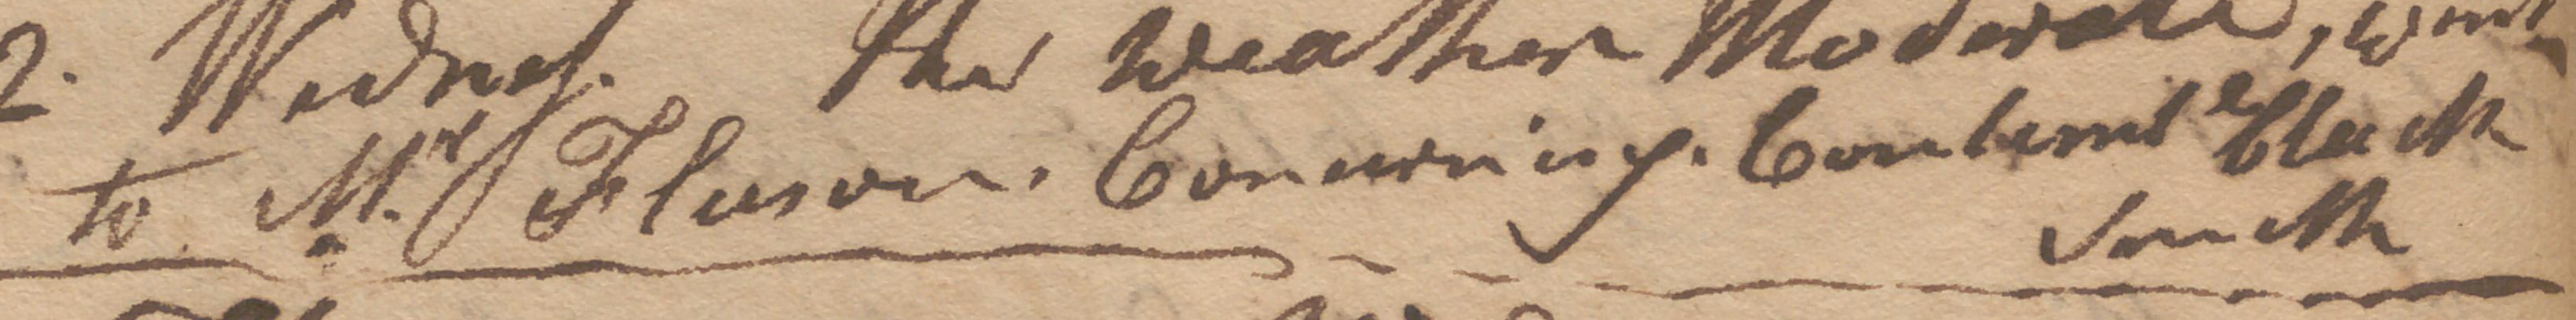to M^r. Fluser Concering Continent^l black
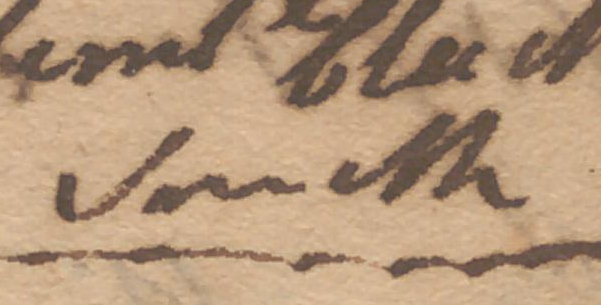Smith
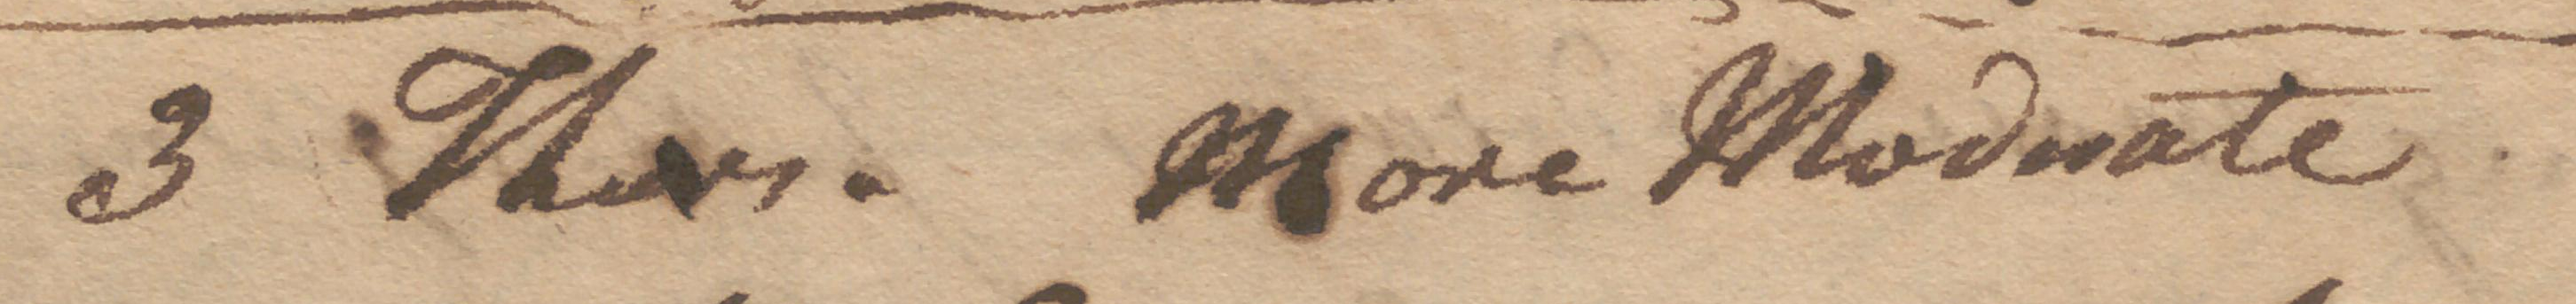3 Thurs. More Moderate
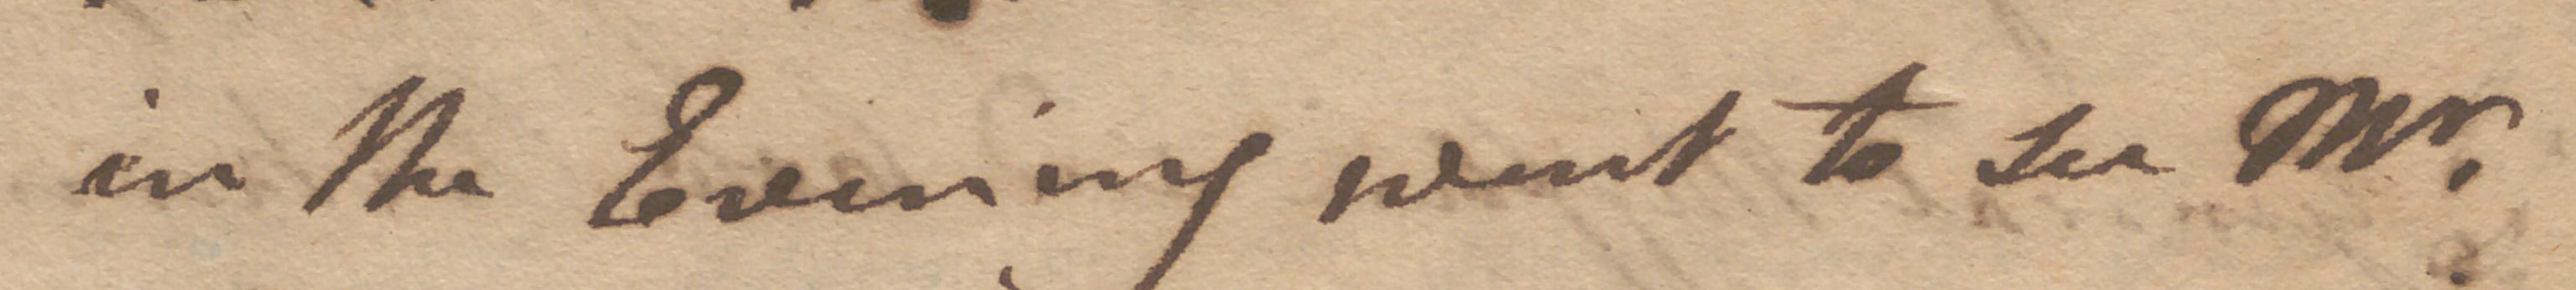in the Evening went to see M^r.
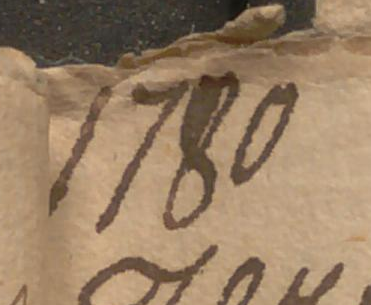1780
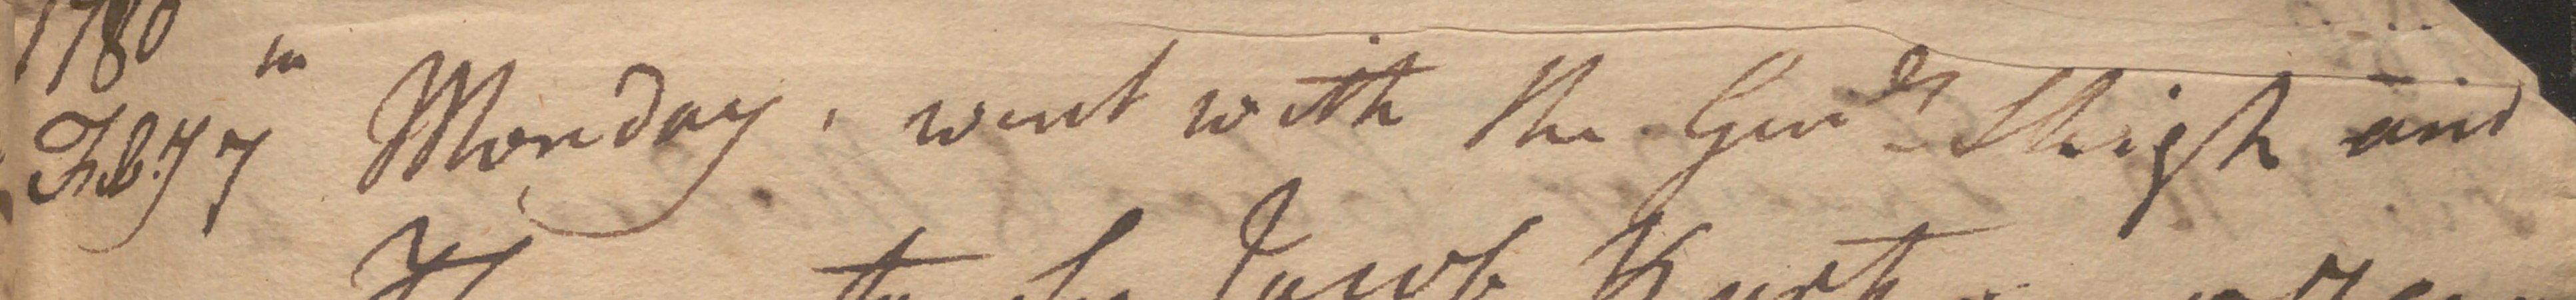Feb^y. 7^th Monday, went with the Gen^ls Sleigh and
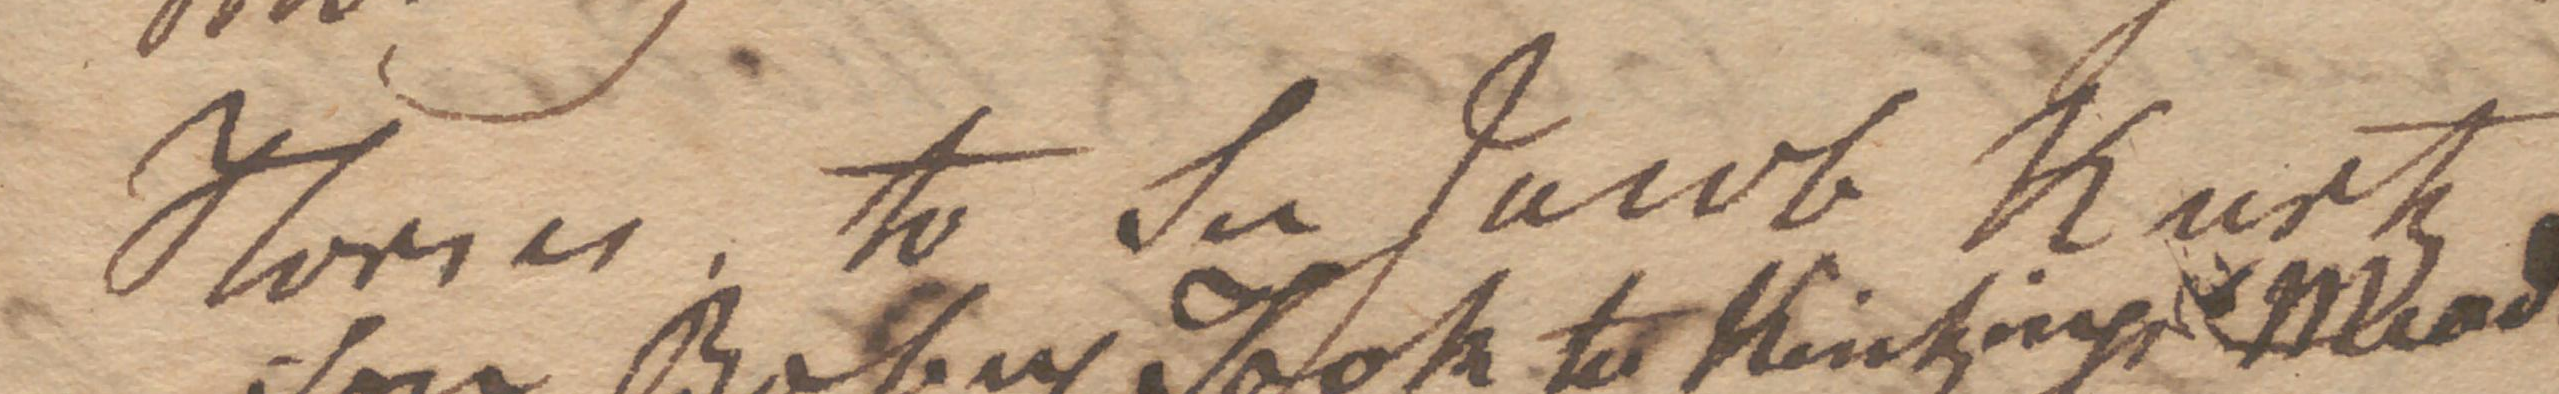Horses to See Jucob Kurtz
